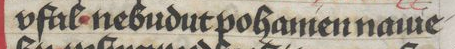vfal.nebudut pohanien nauie¬
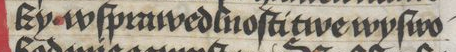ky.wſpravedlnoſti twe wyſwo¬
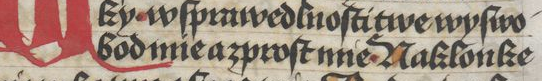bod mie a zproſt mie.Naklonke
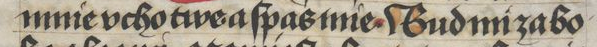mnie vcho twe a ſpas mie.Bud mí za bo¬
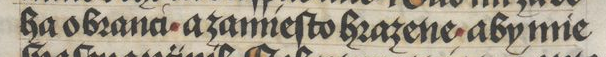ha obranci.a zamíeſto hrazene.aby mie¬
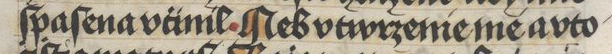ſpaſena vċinil.Neb vtwrzenie mé a vto¬
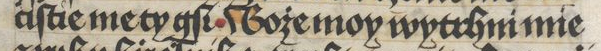ciẛtie me ty gſi.Boże moy wytrhni mie
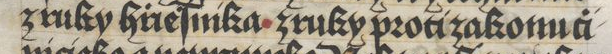z ruky hṙieẛníka.zruky proti zakonu ċi¬
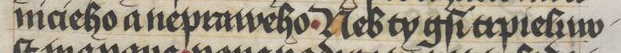nicieho a nepraweho.Neb ty gſí trpieliwo¬
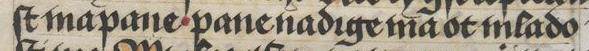ſt ma pane.pane nadige ma ot mlado¬
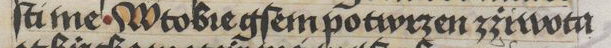ſti me.Wtobie gſem potwrzen zżiwota
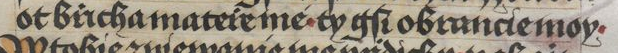ot bṙicha mateṙe mé.ty gſi obrancie moy.
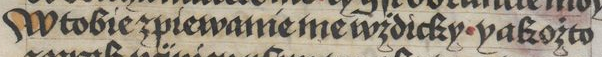Wtobie zpiewanie me wżdicky.yakożto
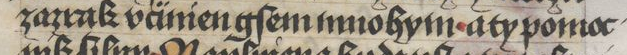zazrak vċinien gſem mnohym. a ty pomoc¬
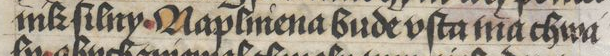nik ſilny.Naplniena bude uſta ma chwá¬
